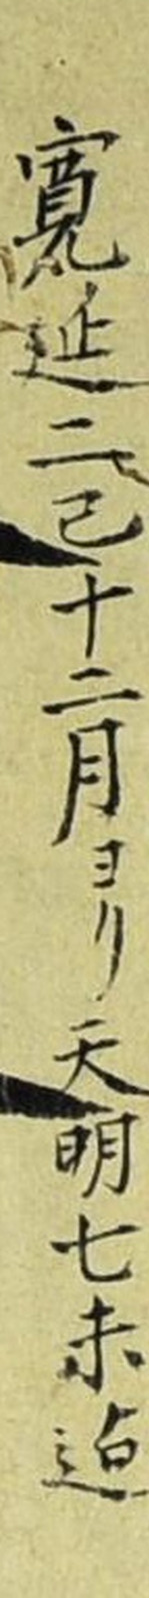寛延二己十二月ヨリ天明七未迠

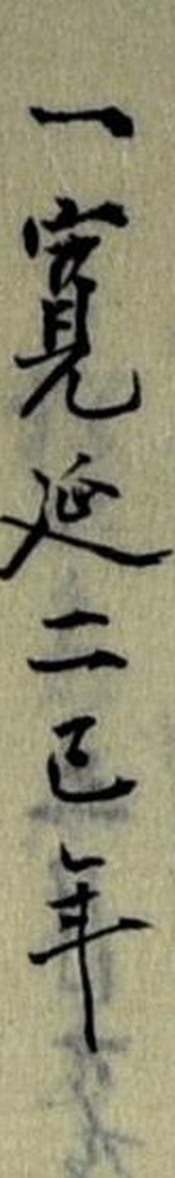一寛延二巳年
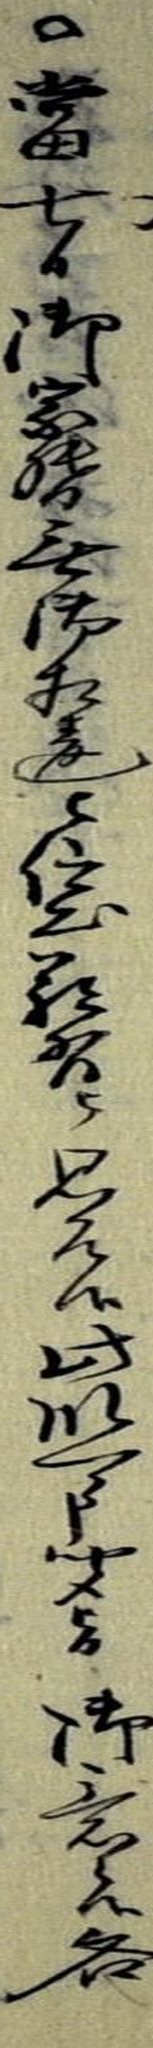○当七日御家督無御相違被仰出難有被思召候此段可申聞旨御意ニ候各
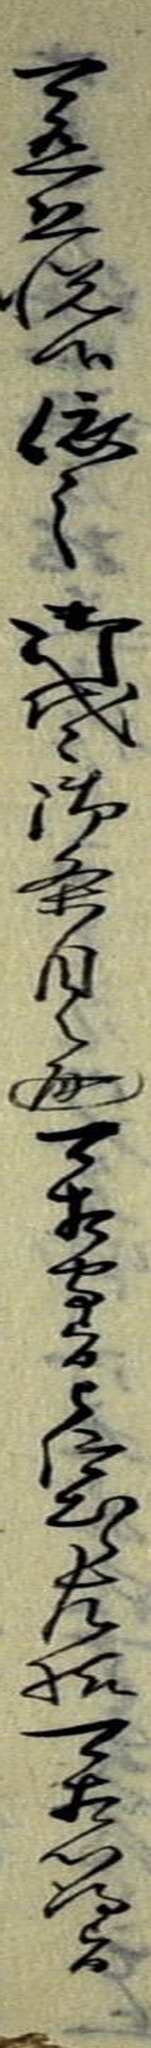可有恐悦候依之御代々御条目之通可相守旨被仰出候左様可相心得旨
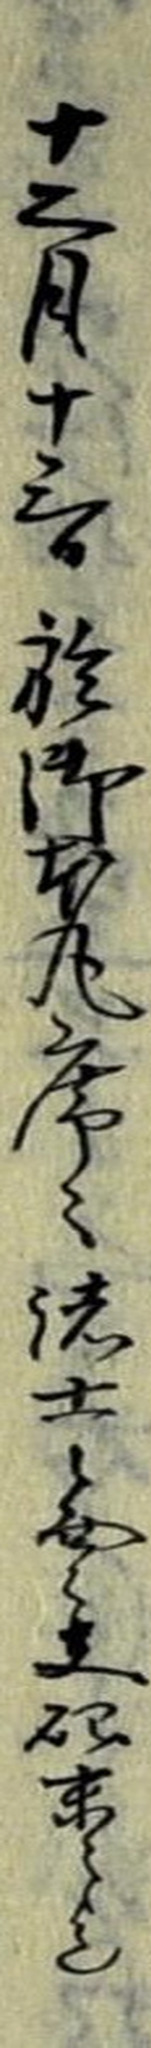十二月十三日於御本丸席々諸士之面々支配末々迄
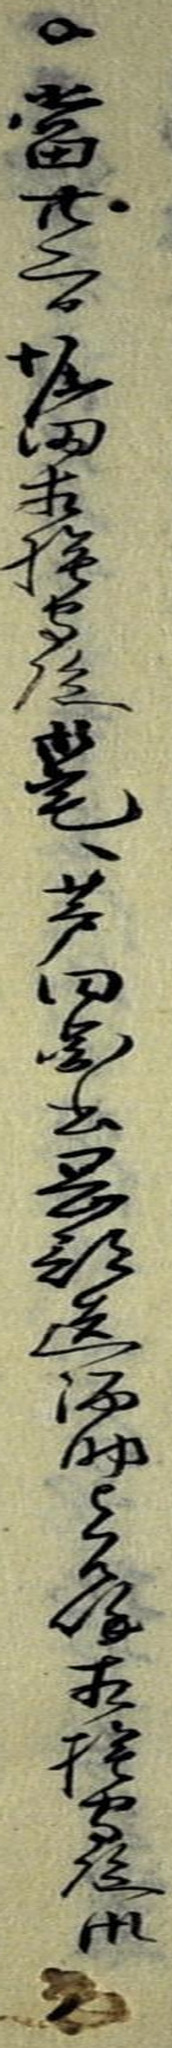○当廿二日堀田相模守殿御宅へ芦田図書・岡部造酒助被召呼相模守殿御
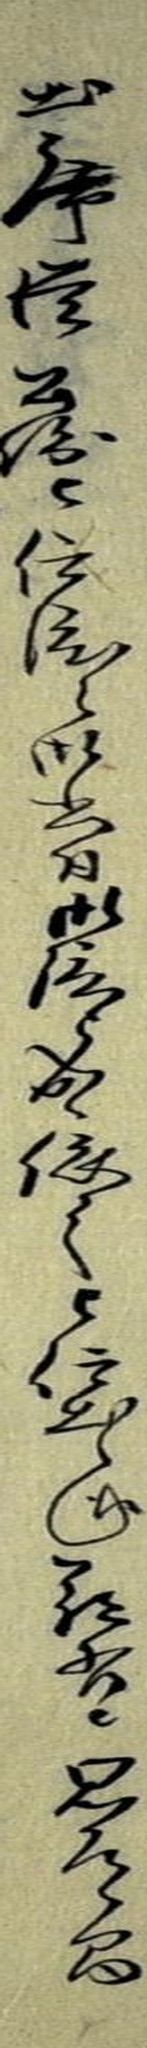出席従公儀被仰渡之御書付御渡被成候依之被仰出候趣難有被思召候間
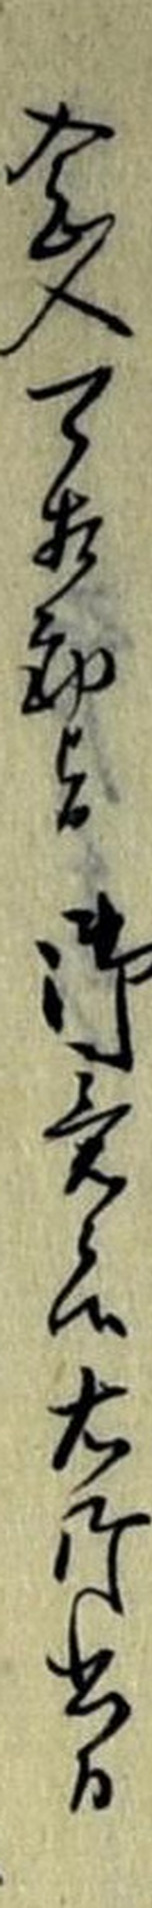念入可相勤旨御意ニ候右御書付
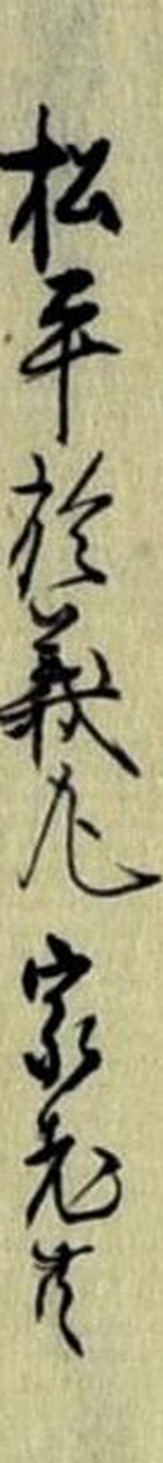松平於義丸家老共
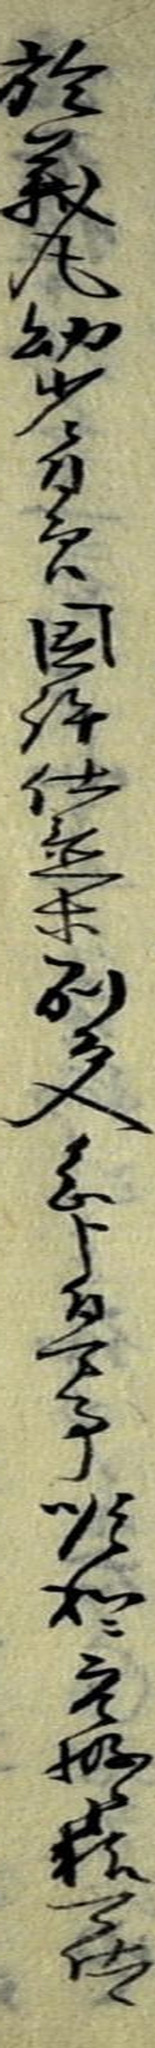於義丸幼少ニ付而ハ国許仕置等別而入念申付万事順和ニ取扱候様可仕候
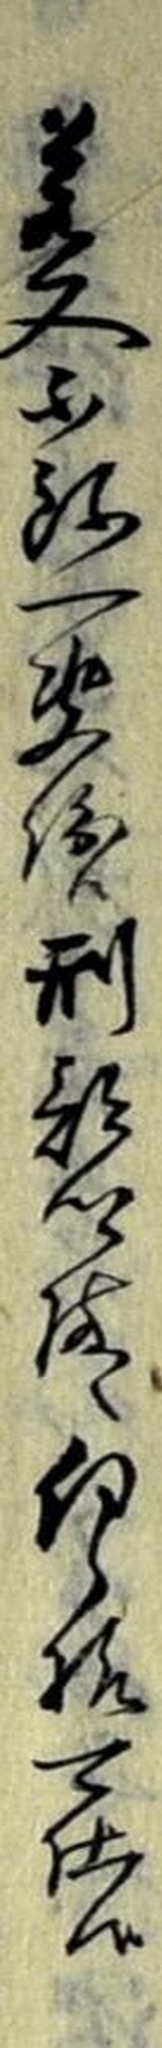若又不致一決儀ハ刑部卿殿へ伺候様可仕候
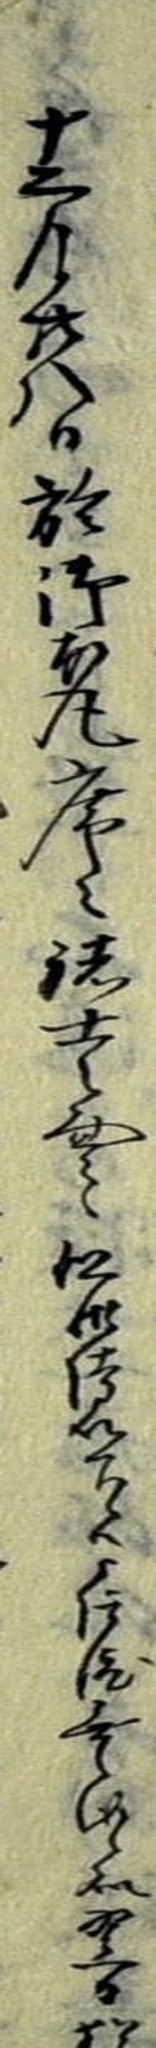十二月廿八日於御本丸席々諸士之面々但御侍以下ヘハ被仰渡無之趣候処翌日猶
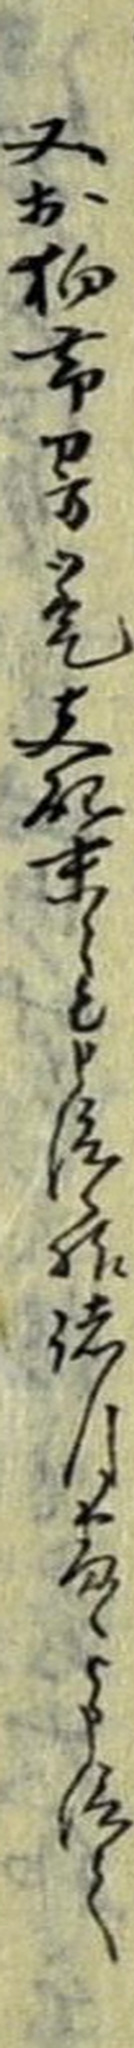又於狛帯刀方御宅支配末々迄申渡候様諸月番へ被申渡之

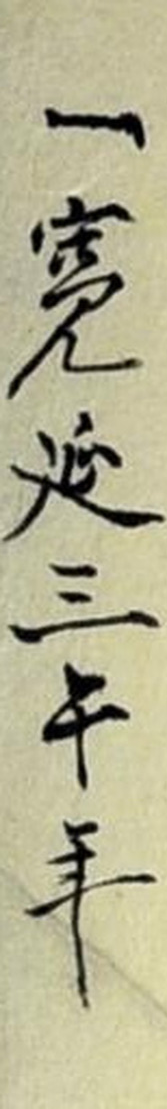一寛延三午年
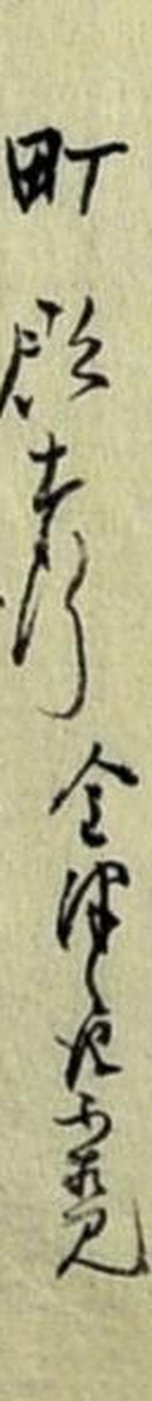町郡奉行金津之儀不相見
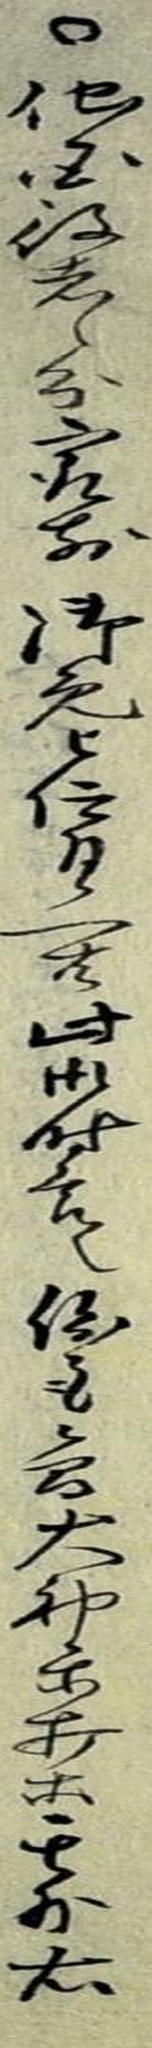○他国役者之分最前御免被仰付候へ共此御時節之儀ニも候間大神楽打等其外右
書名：命令之部 二
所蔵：福井県文書館 Fukui Prefectural Archives
